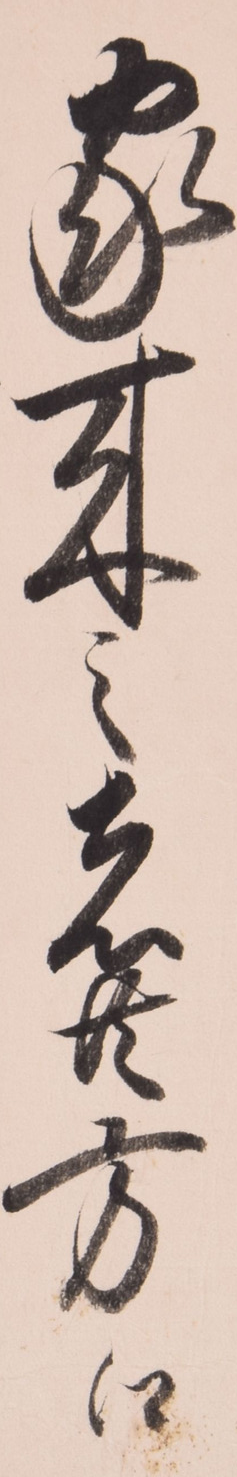家来之者共方江
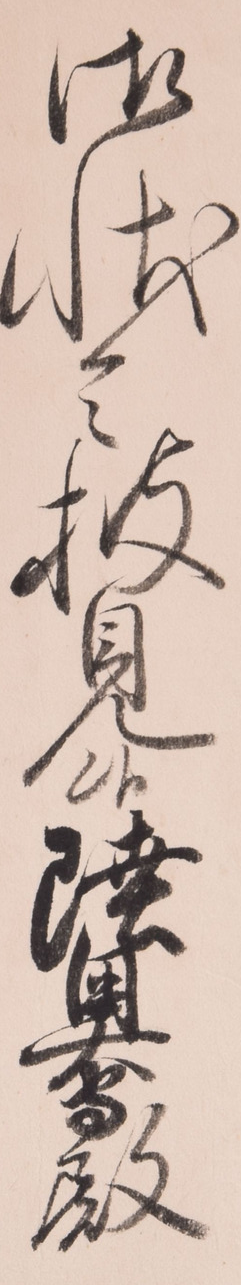御状令披見候陸奥守殿
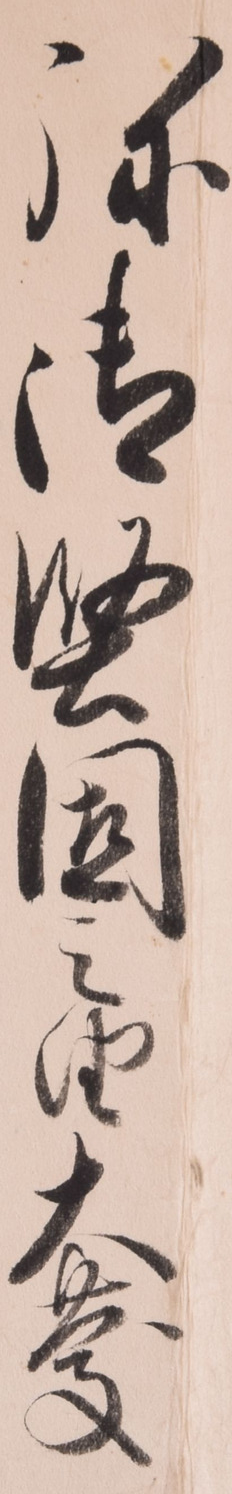弥御堅固之由大慶
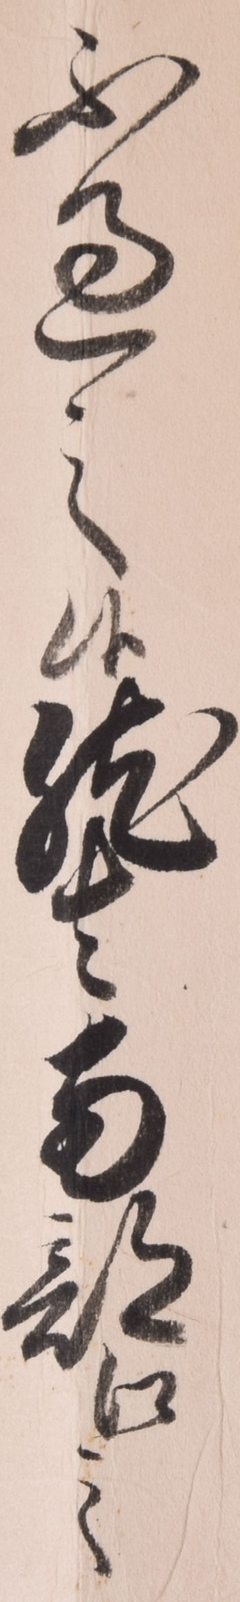不過之候然者南部江之

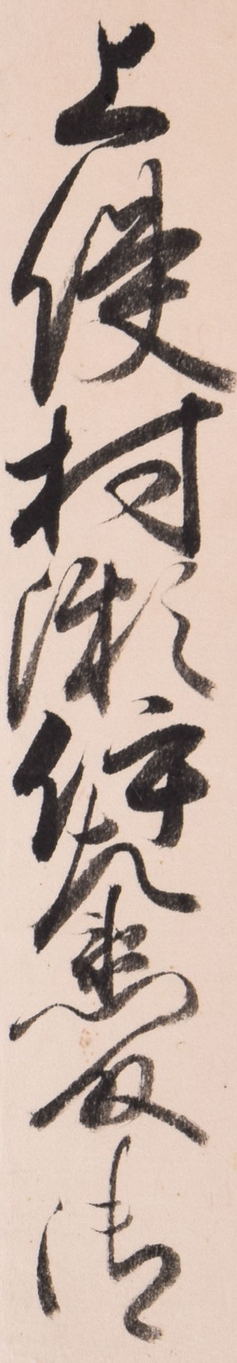上使村瀬伊左衛門殿御
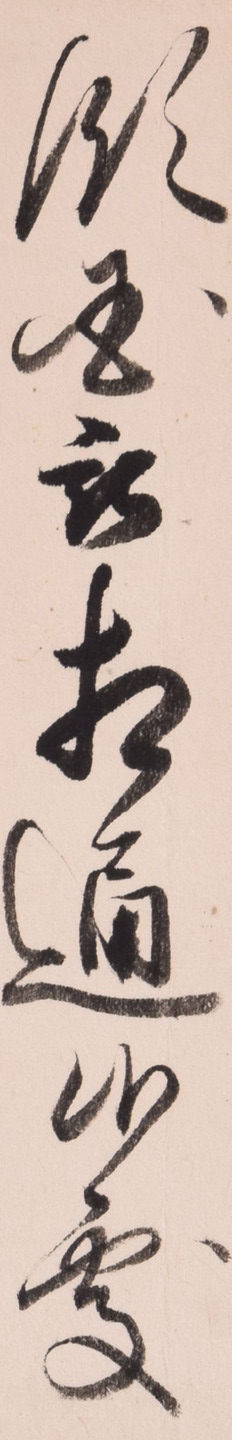領国被相通候処
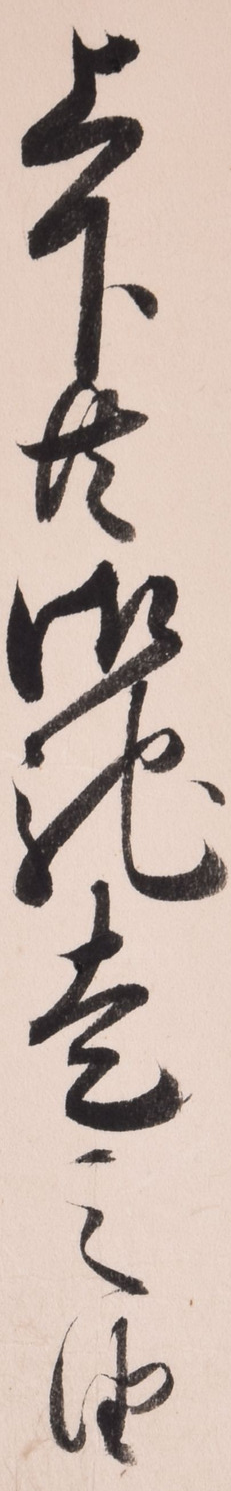上下共御馳走之由
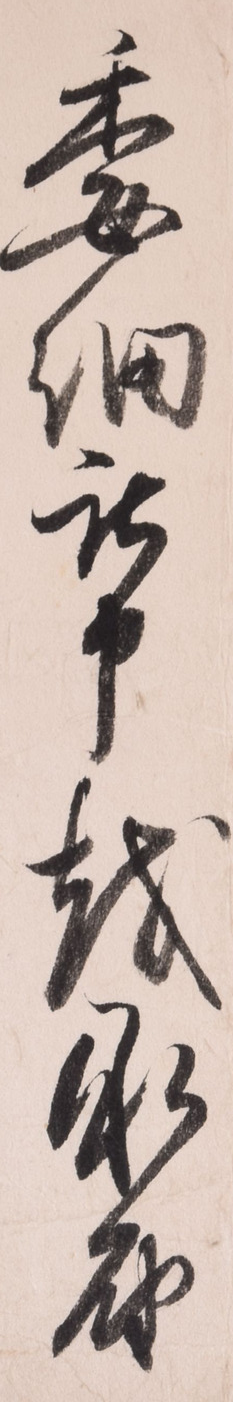委細被申越承届
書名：「家来之者〜」
